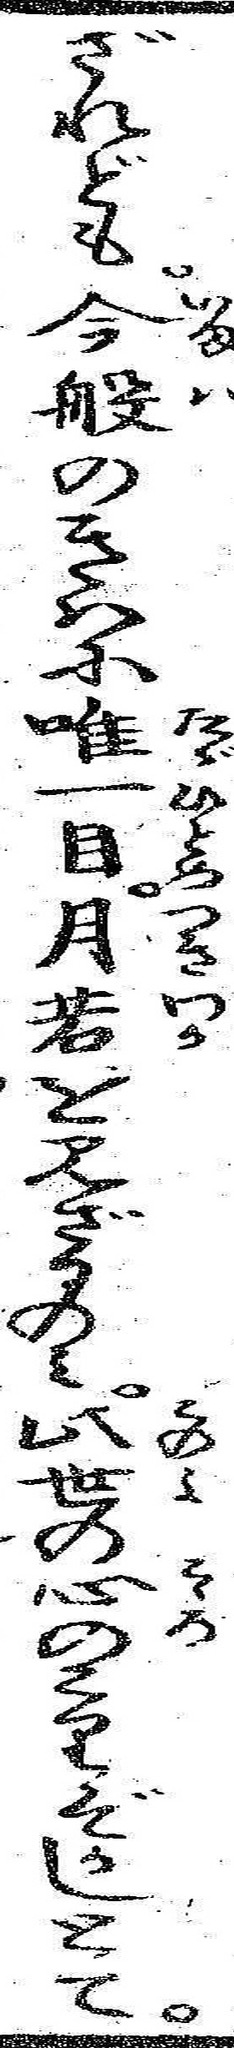ざれども。今般のきはに唯一目。月若を見ざるのみ。此世の心のこりぞかしとて。
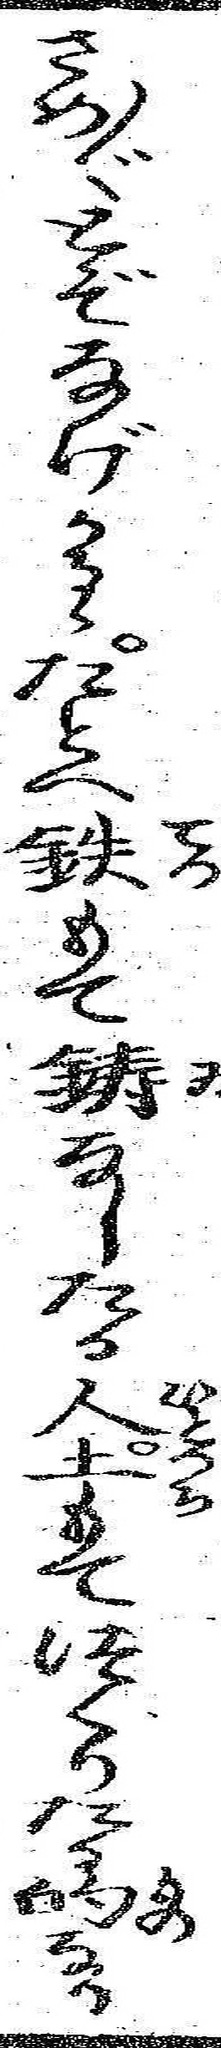さめ〴〵とぞなげかるゝ。たとへ鉄もて鋳なしたる人。土もてつりたる的なり
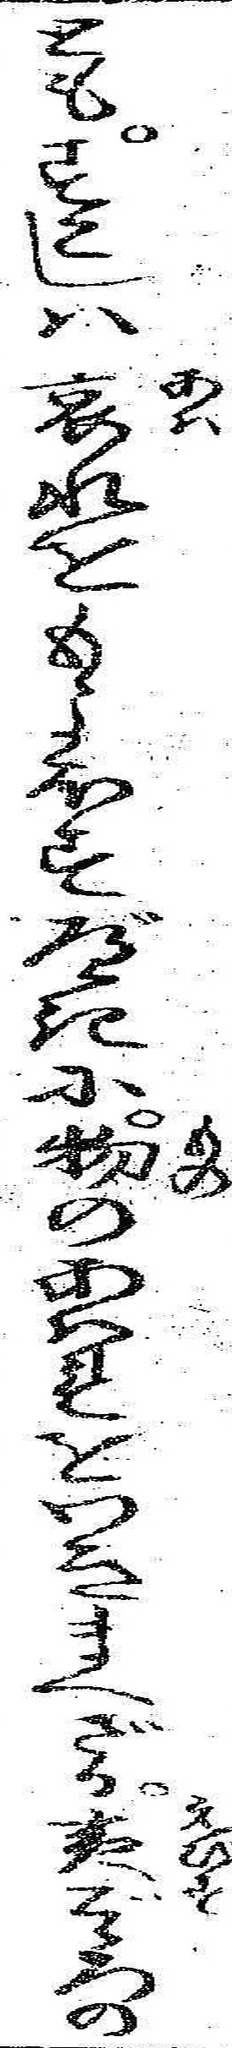とも。すこしは哀れをもよほすべきに。物のあはれをわきまへざる。夷ごゝろの
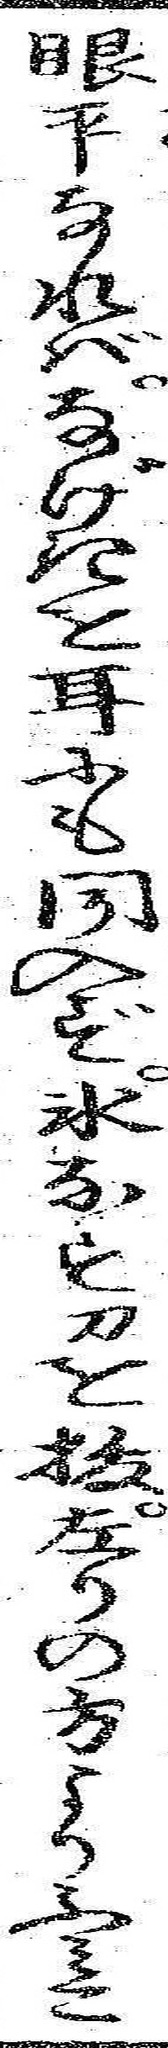眼平なれば。なげきを耳にも聞入ず。氷なす刀を抜。左りの方よりふみこ
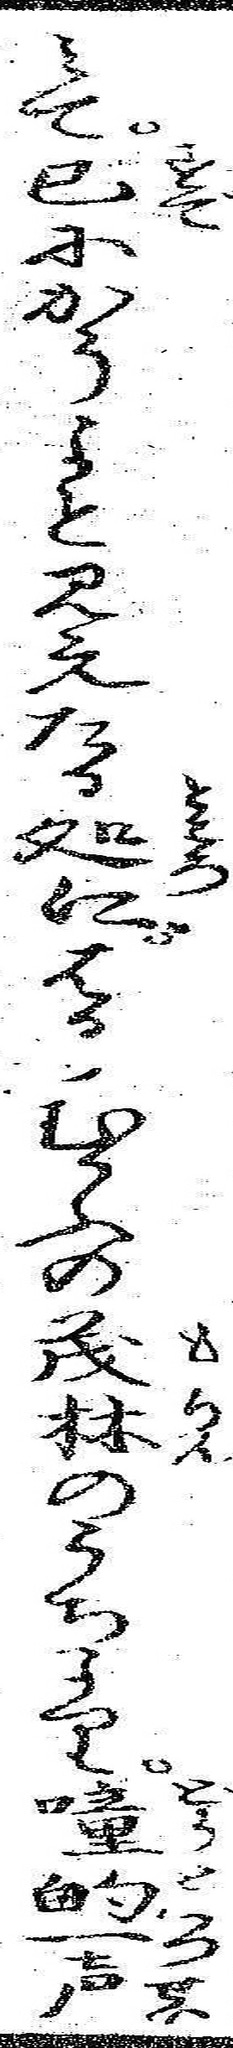みて。已にかうよと見えたる処に。はるかむかふの茂林のうちより。噇的一声
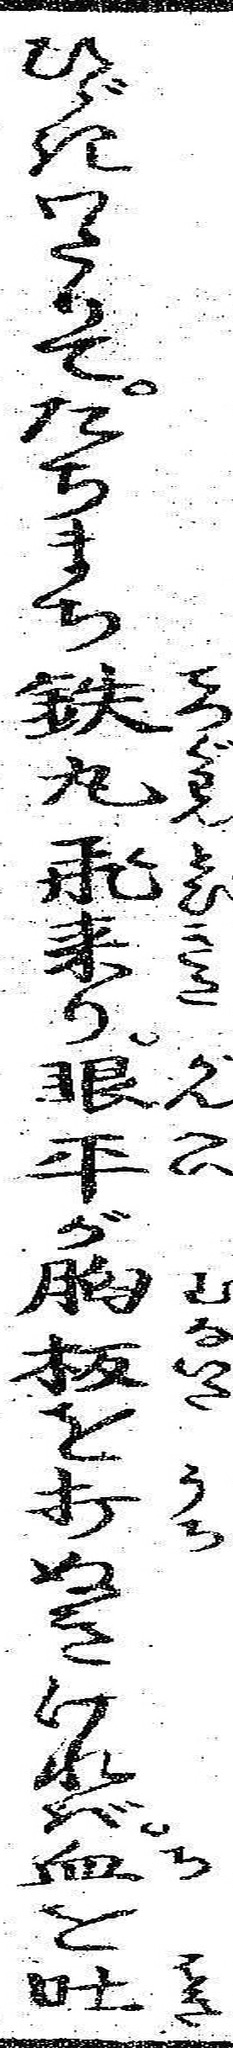ひゞきわたりて。たちまち鉄丸飛来り。眼平が胸板を打ぬきければ。血を吐
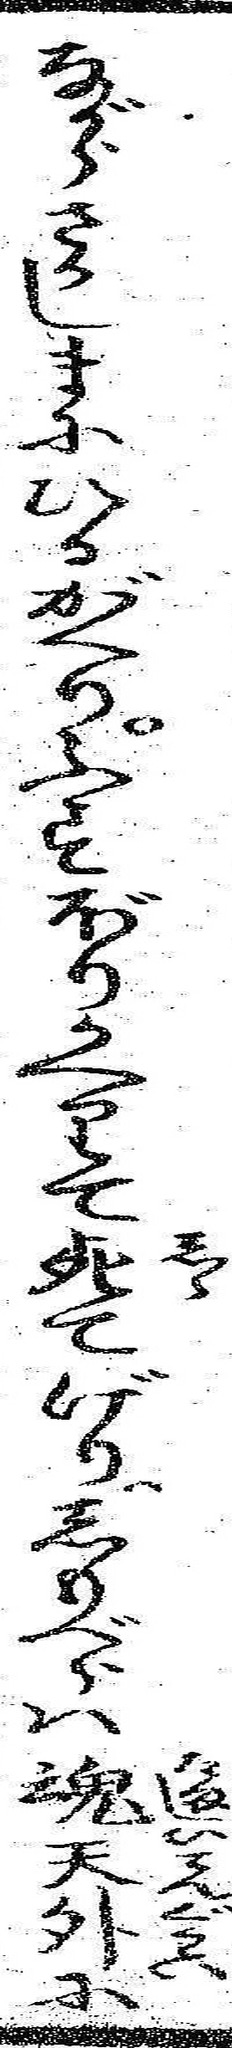ながらさかしまにひるがへり。ふすぼりかへりて死てげり。しもべらは魂天外に
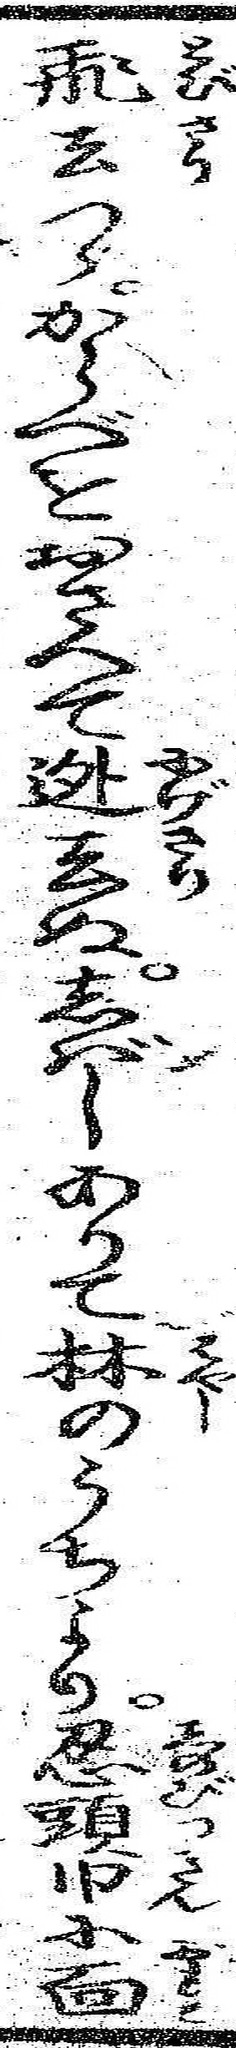飛去つゝ。かうべをおさへて逃去ぬ。しばしありて林のうちより。忍頭巾に面
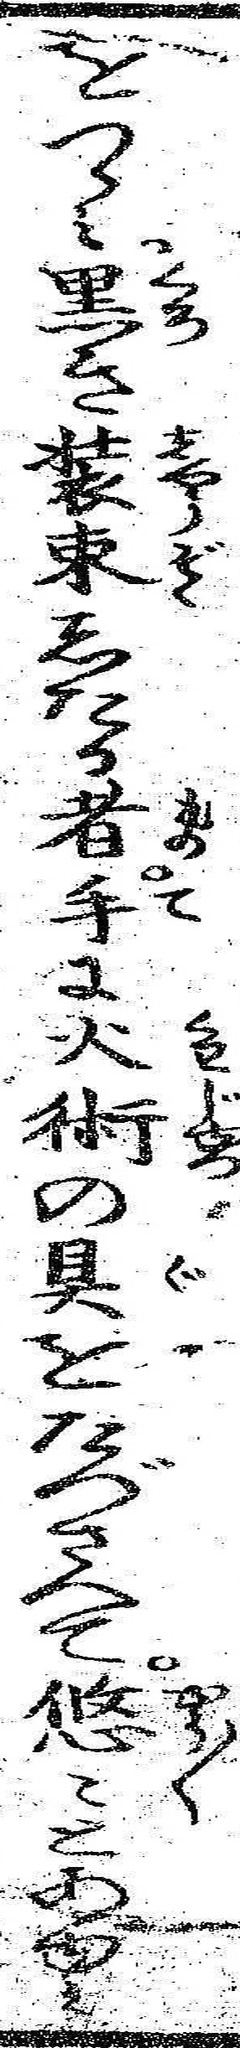をつゝみ。黒き装束したる者。手に火術の具をたづさへて。悠々とあゆみ
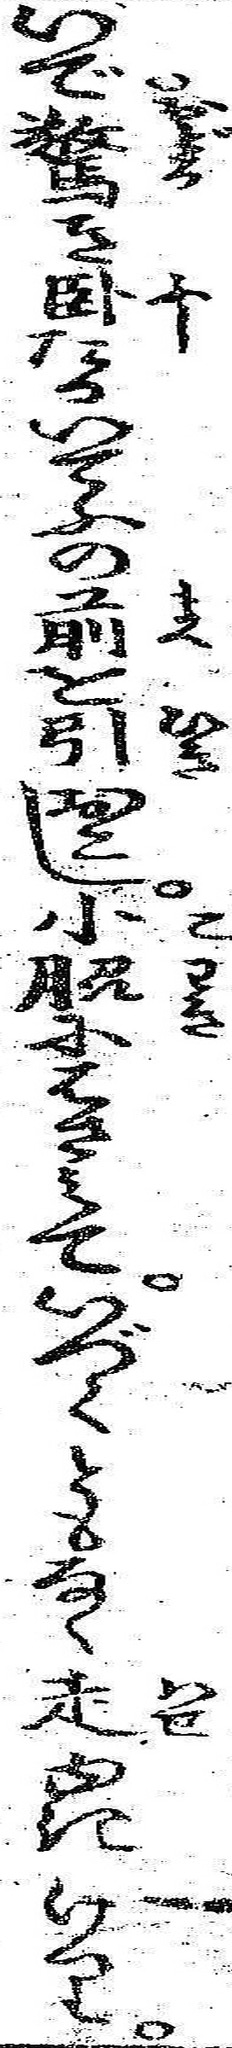いで。驚き臥たるいてふの前を引おこし。小脇にはさみて。いづくともなく走ゆきけり。

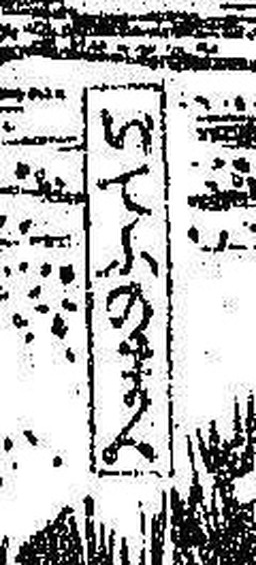いてうのまへ
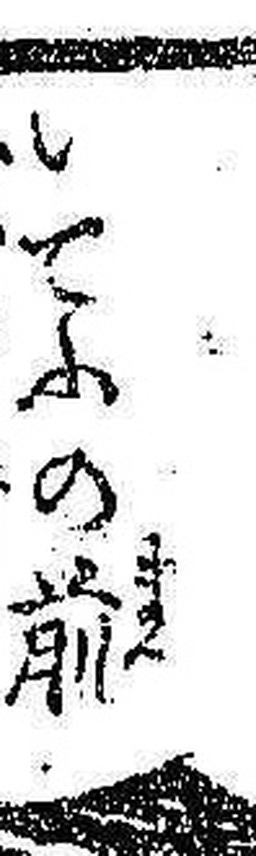いてふの前
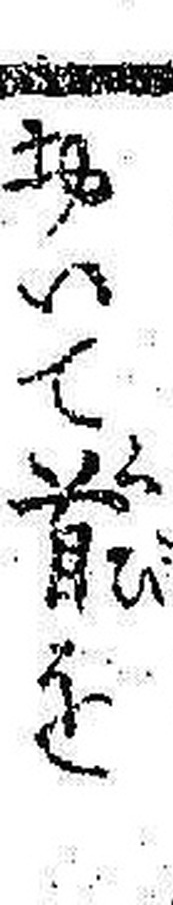おいて首を
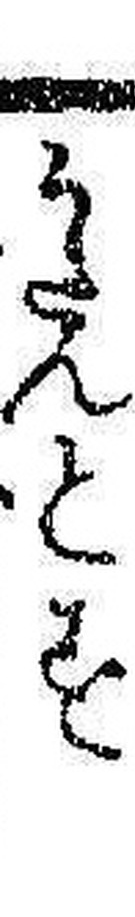うたんとす
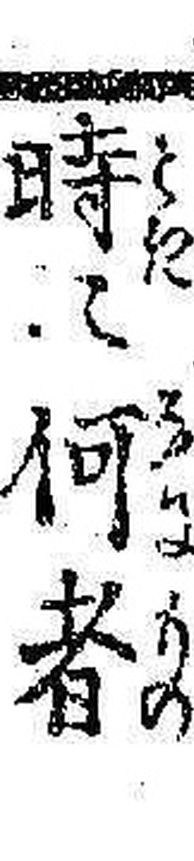時に何者
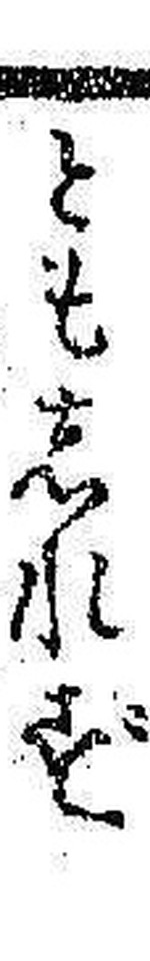ともしれず
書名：昔話稲妻表紙
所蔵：国文学研究資料館
